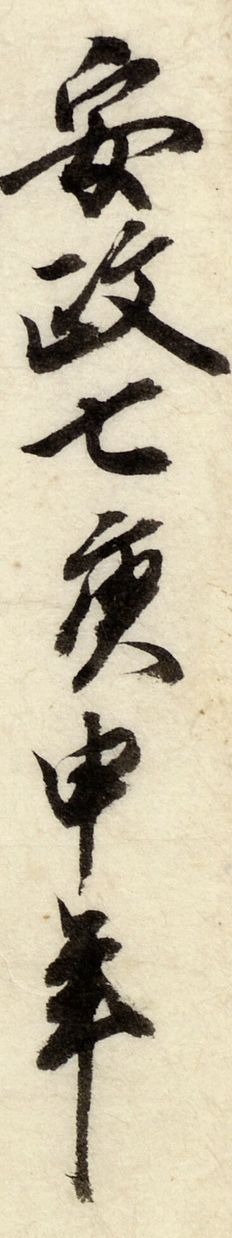安政七庚申年
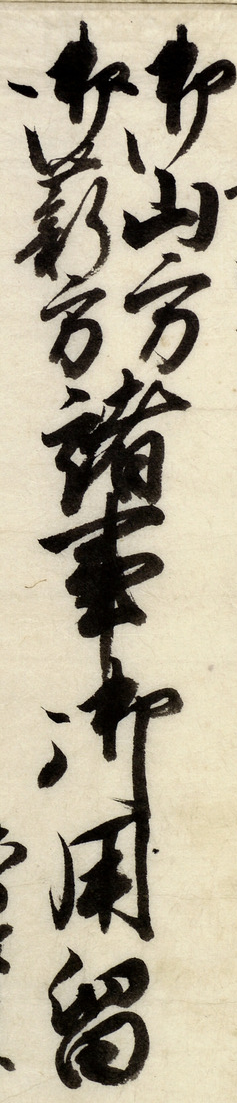御薪方諸事御用留
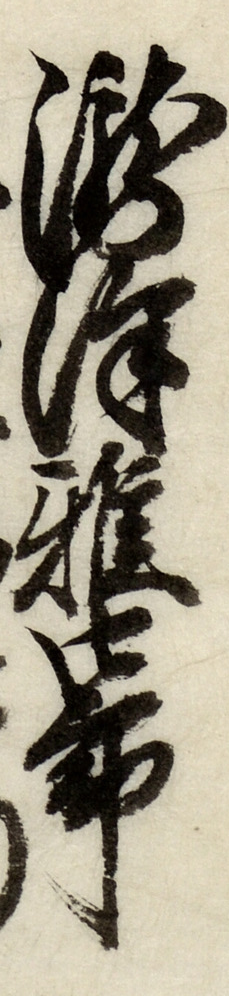瀧沢雅四郎
